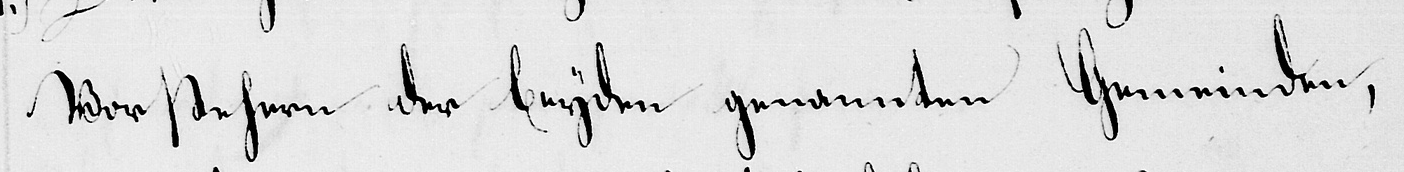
Vorstehern der beyden genannten Gemeinden,
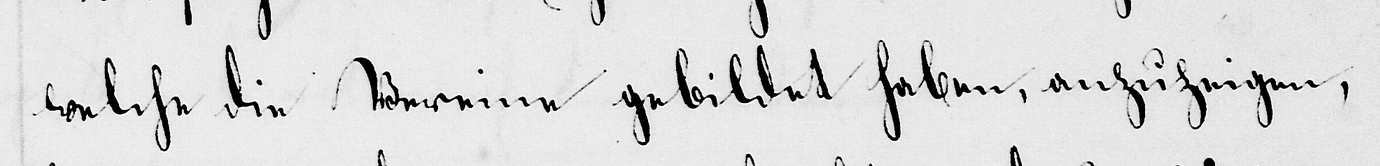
welche die Vereine gebildet haben, anzuzeigen,
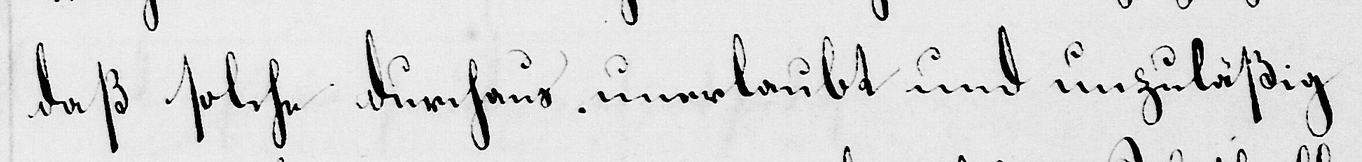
daß solche durchaus unerlaubt und unzuläßig
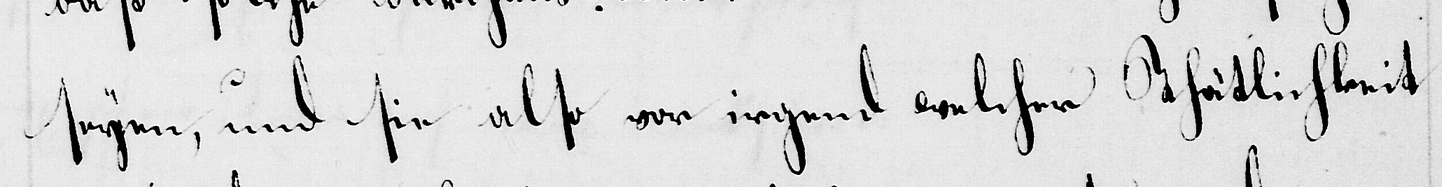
seyen, und sie also vor irgend welcher Thätlichkeit
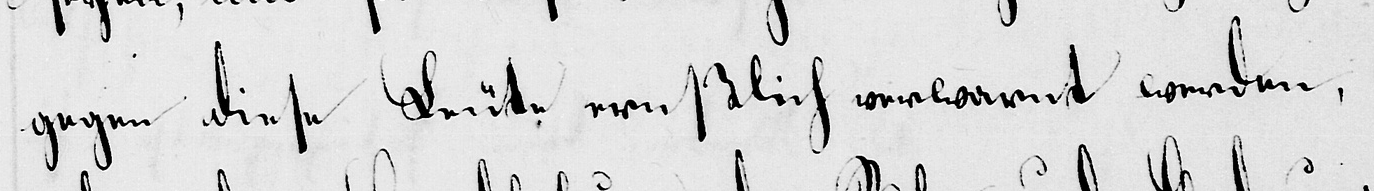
gegen diese Leute ernstlich verwarnt werden,
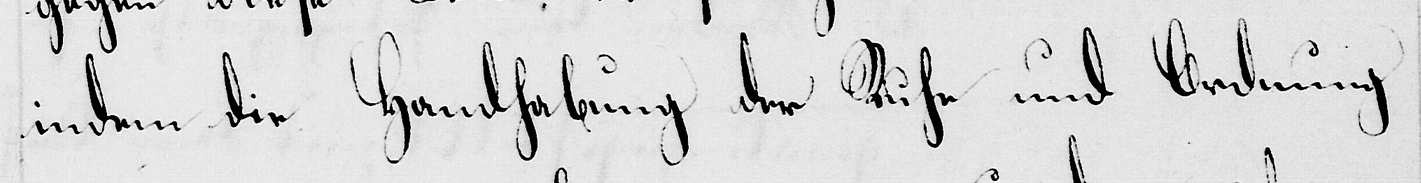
indem die Handhabung der Ruhe und Ordnung
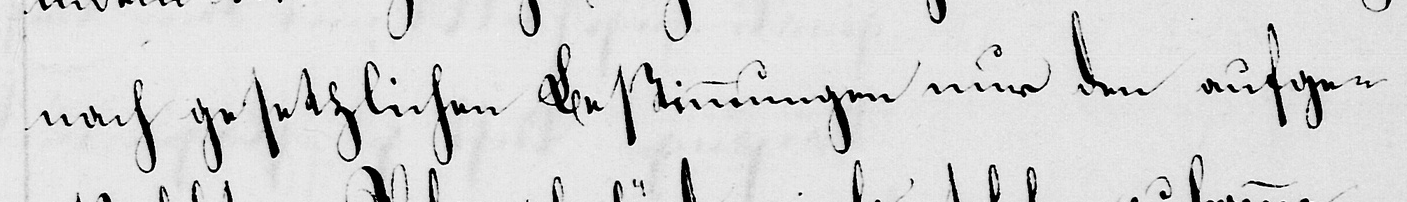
nach gesetzlichen Bestimmungen nur den aufge¬
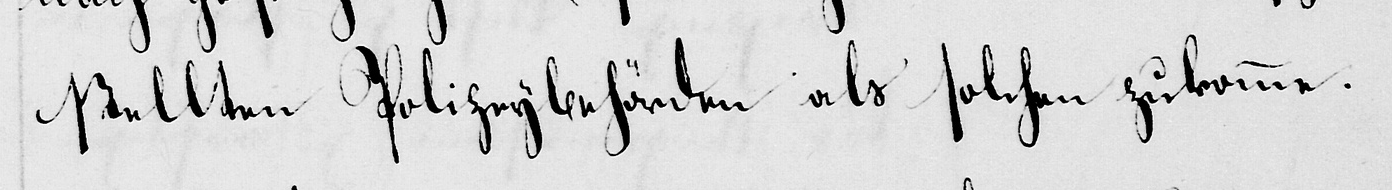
stellten Polizeybehörden als solchen zukomme.
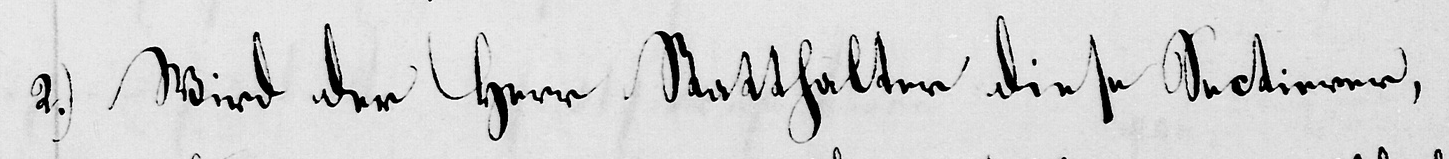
2.) Wird der Herr Statthalter diese Sectierer,
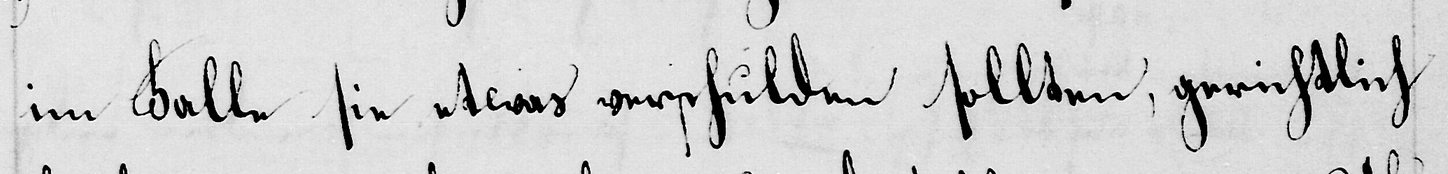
im Falle sie etwas verschulden sollten, gerichtlich
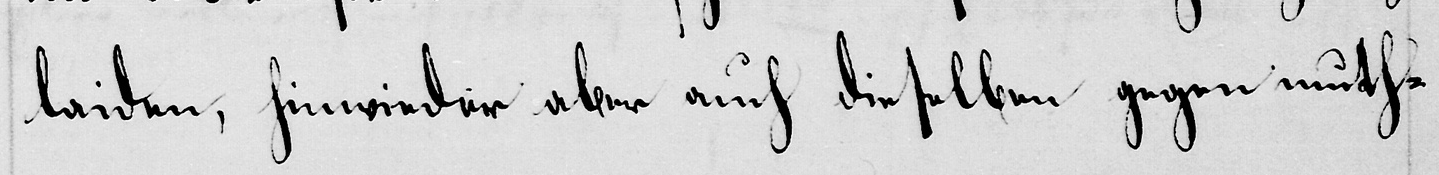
laiden, hinwieder aber auch dieselben gegen muth-
